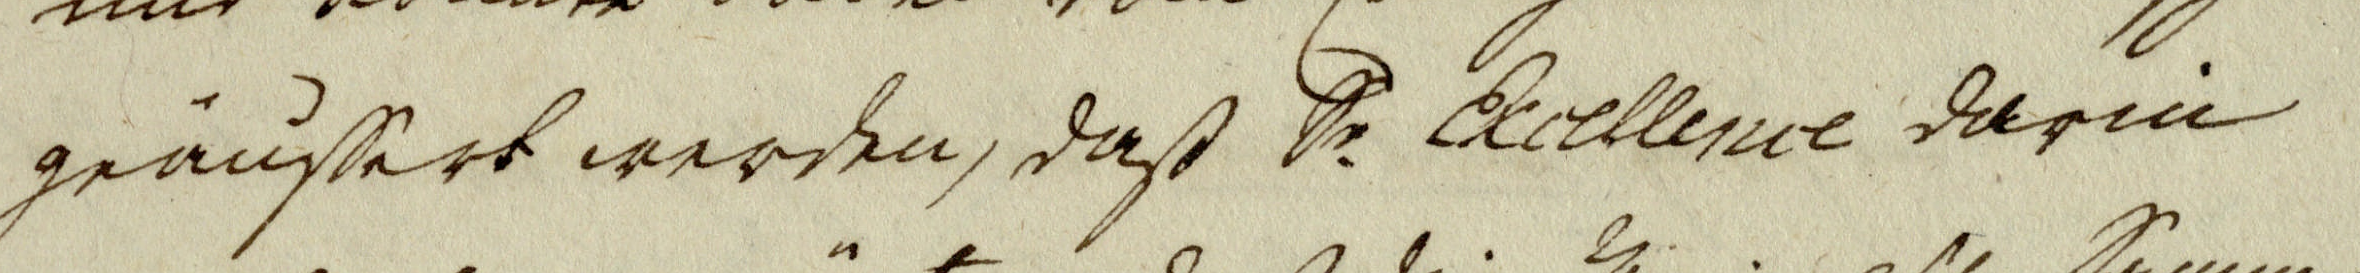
geäussert werden, daß Sr Excellence darin
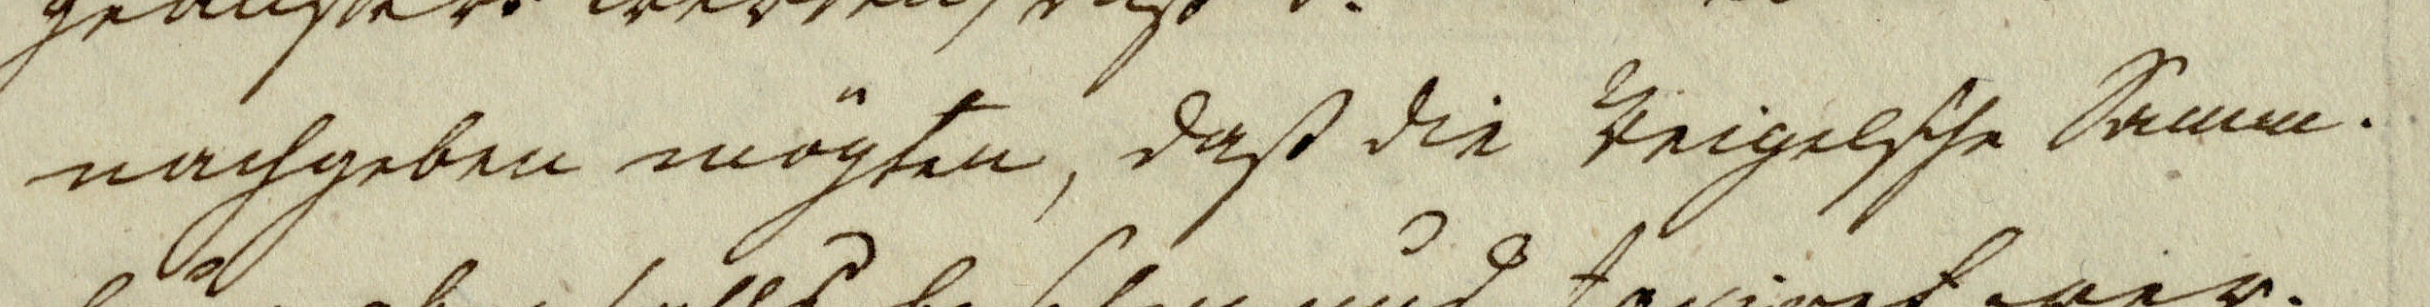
nachgeben mögten, daß die Weigelsche Samm¬
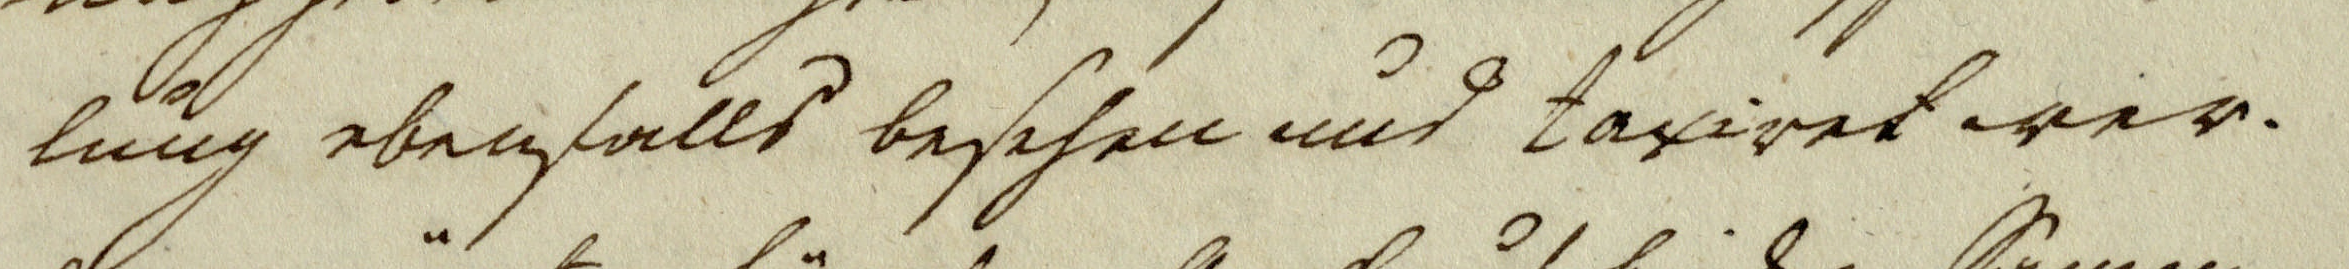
lung ebenfalls besehen und taxiret wer¬
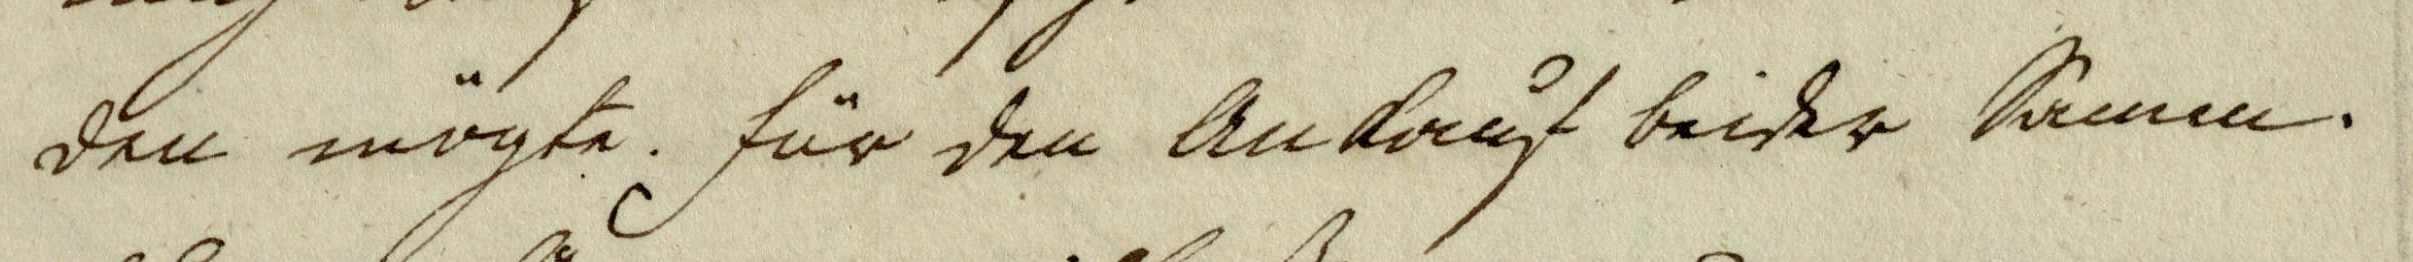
den mögte. für den Ankauf beider Samm¬
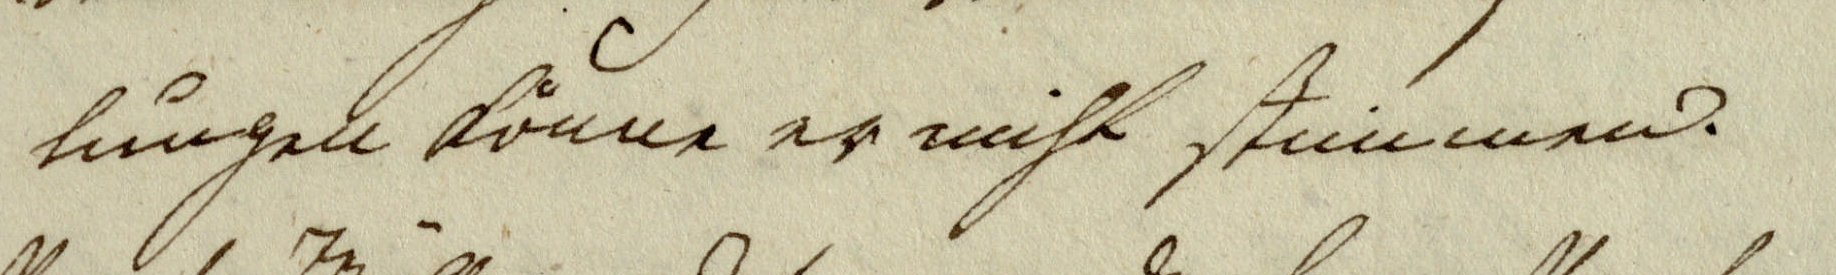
lungen könne er nicht stimmen.
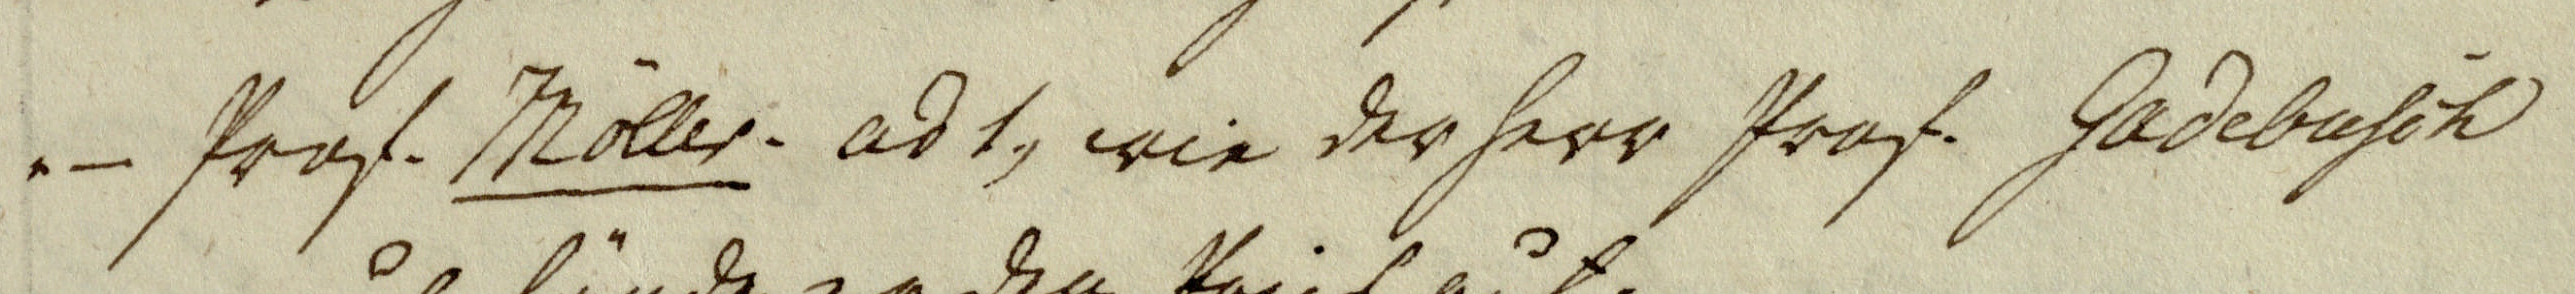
Prof. Möller. ad 1., wie der Herr Prof. Gadebusch
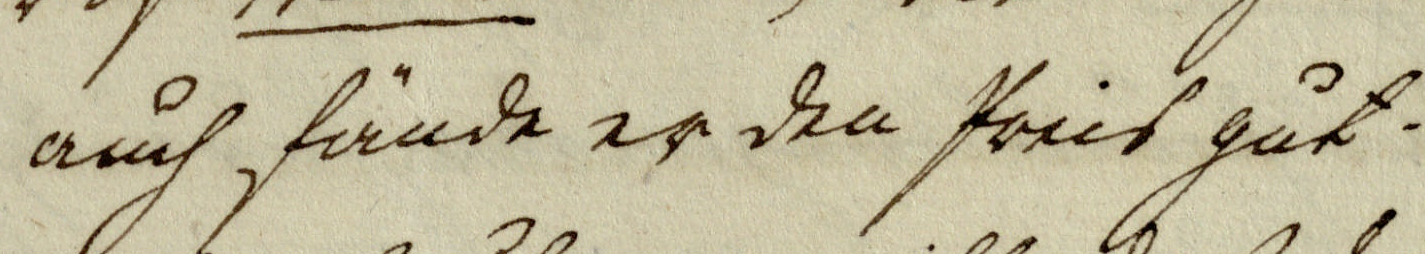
auch fände er den Preis gut
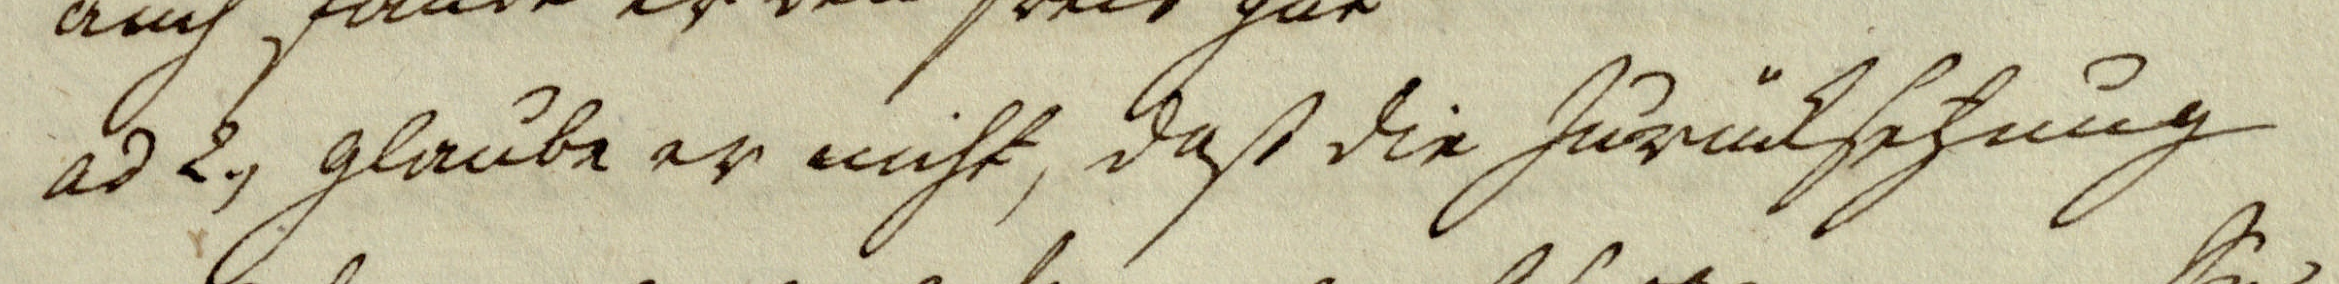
ad 2., glaube er nicht, daß die Zurücksetzung
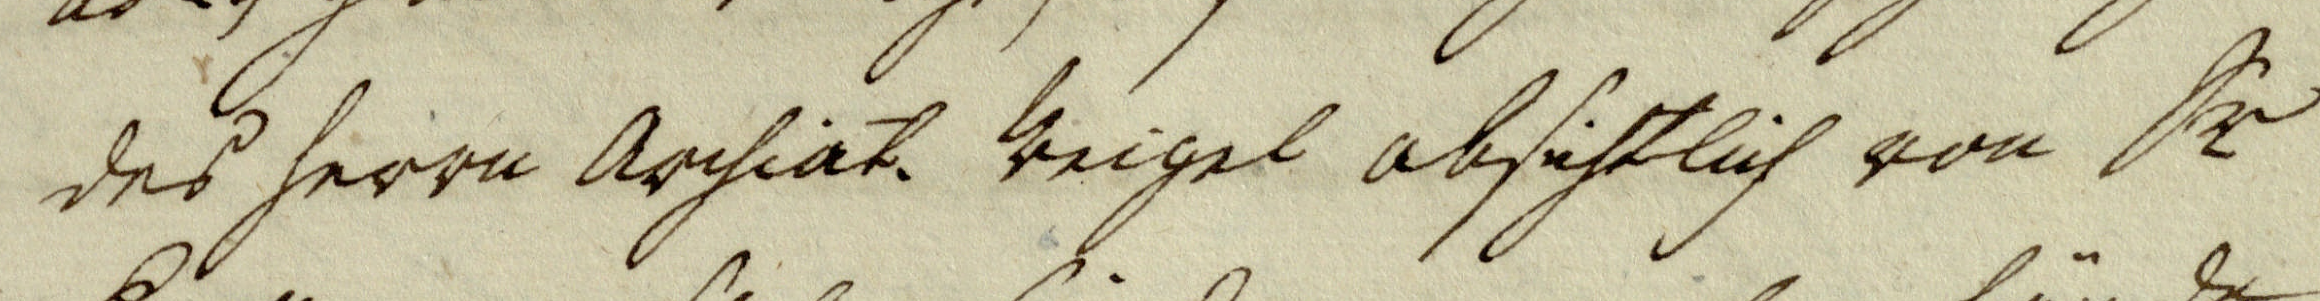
des Herrn Arhiat. Weigel absichtlich von Sr
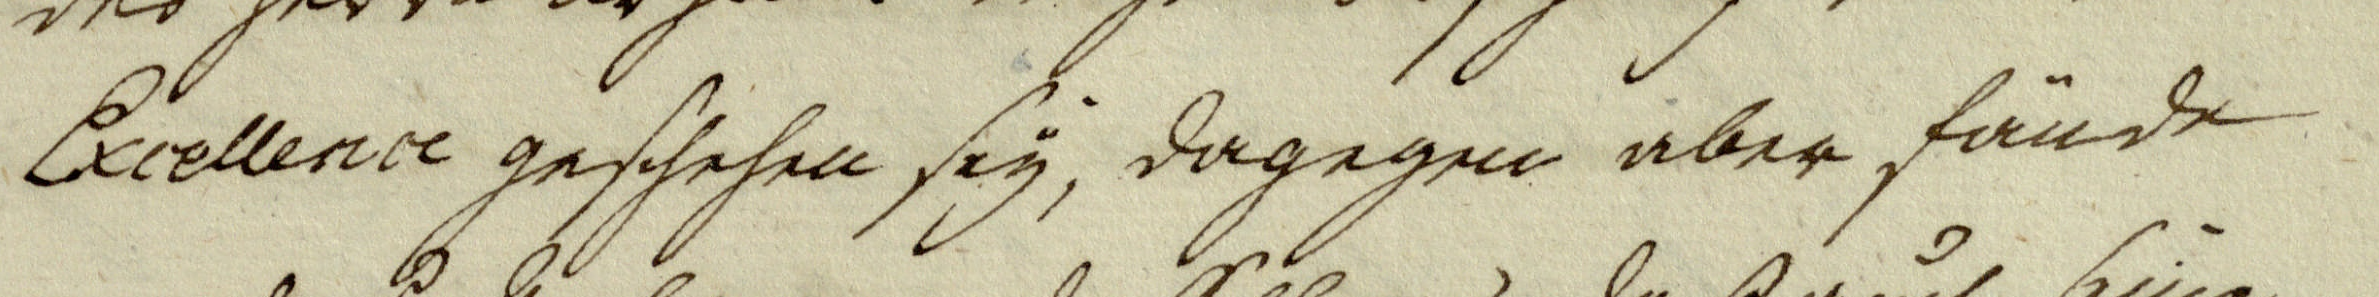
Excellence geschehen seÿ, dagegen aber fände
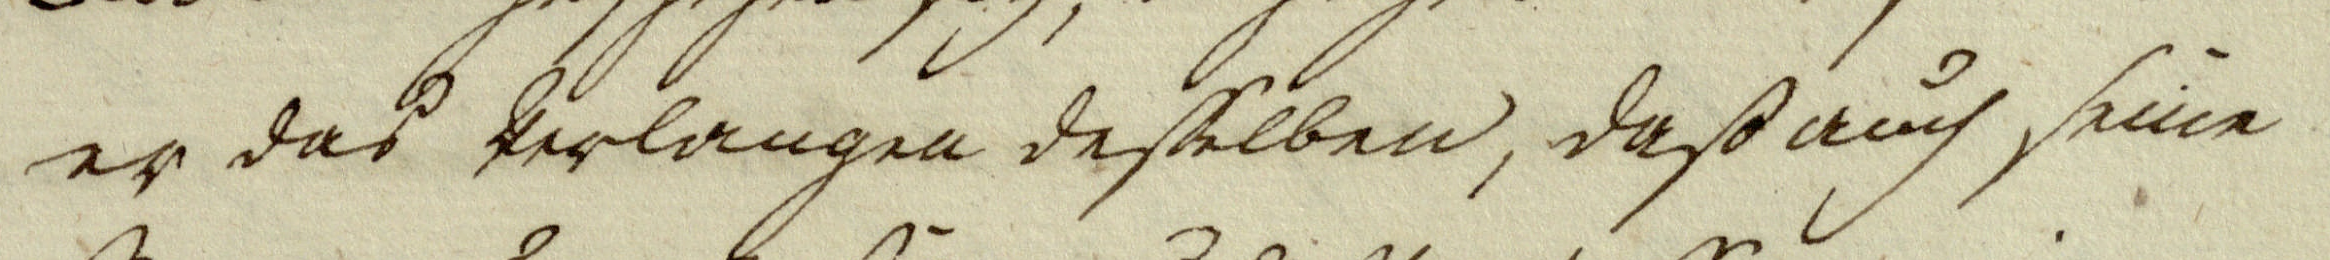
er das Verlangen desselben, daß auch seine
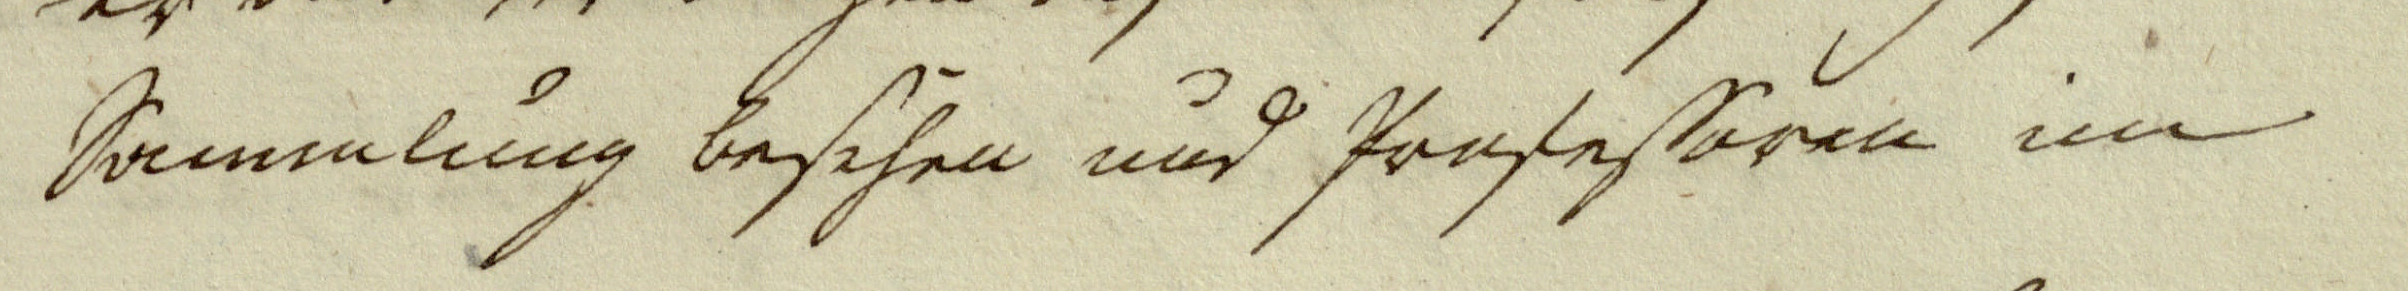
Sammlung besehen und Professoren im
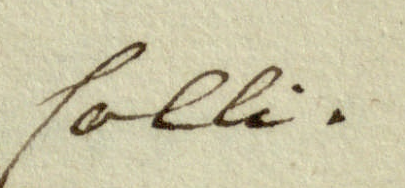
Colli¬
